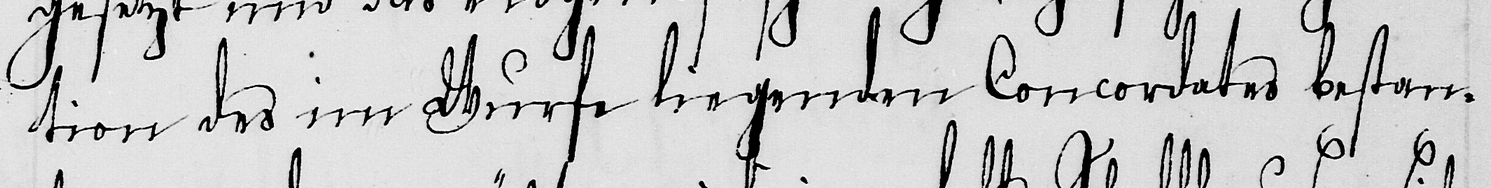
tion des im Wurfe liegenden Concordates bestan¬
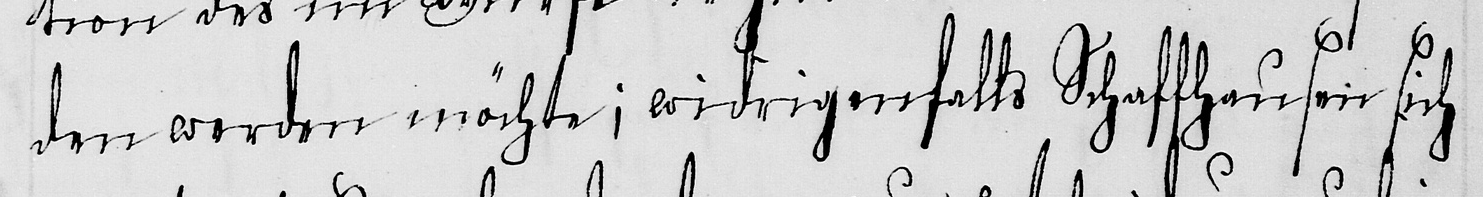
den werden möchte; widrigenfalls Schaffhausen sich
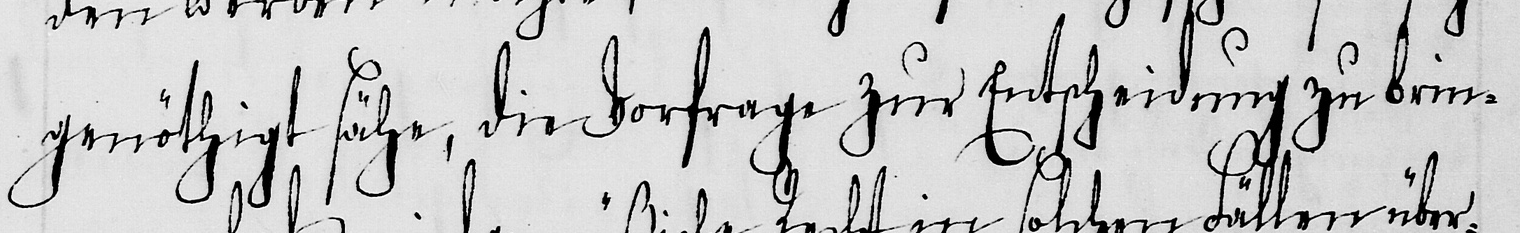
genöthigt sähe, die Vorfrage zur Entscheidung zu brin¬
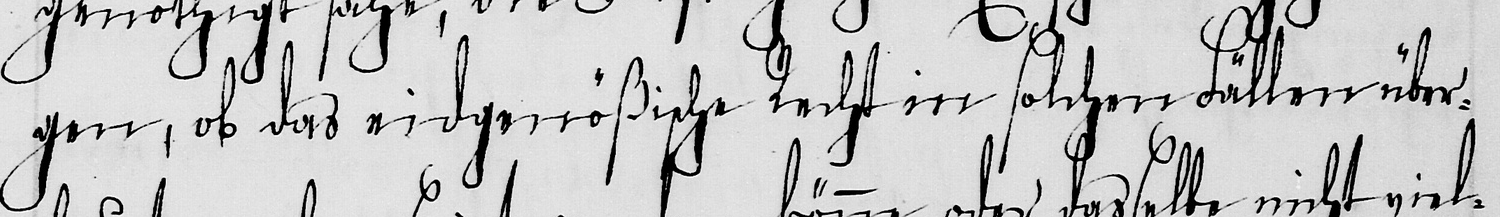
gen, ob das eidgenößische Recht in solchen Fällen über¬
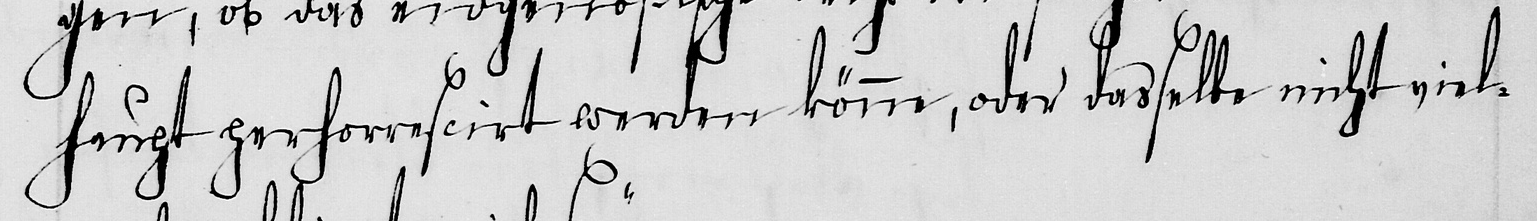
haupt perhorrescirt werden könne, oder dasselbe nicht viel¬
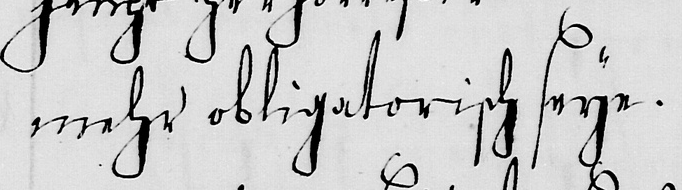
mehr obligatorisch seye.
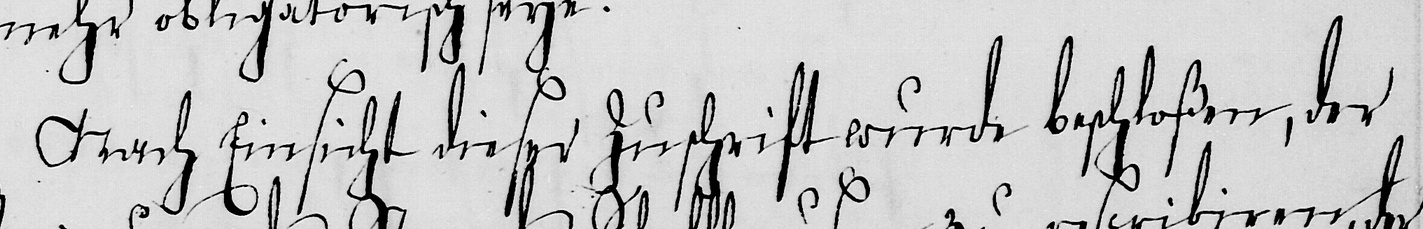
Nach Einsicht dieser Zuschrift wurde beschloßen, der
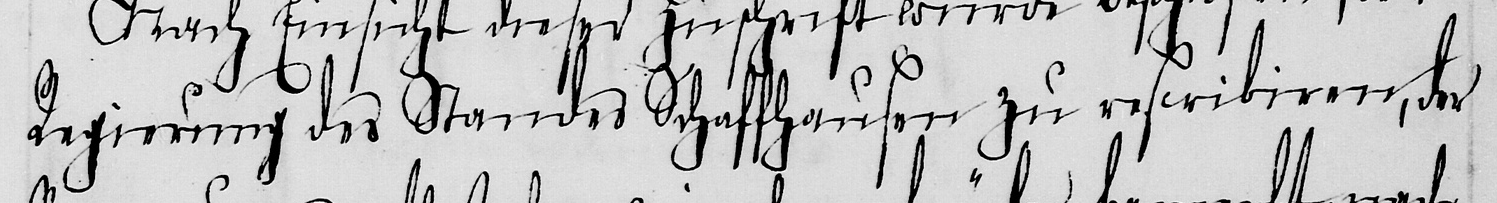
Regierung des Standes Schaffhausen zu rescribiren, der
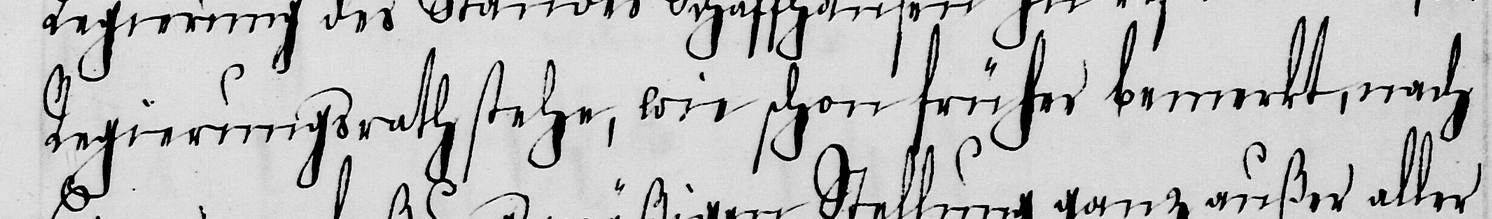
Regierungsrath stehe, wie schon früher bemerkt, nach
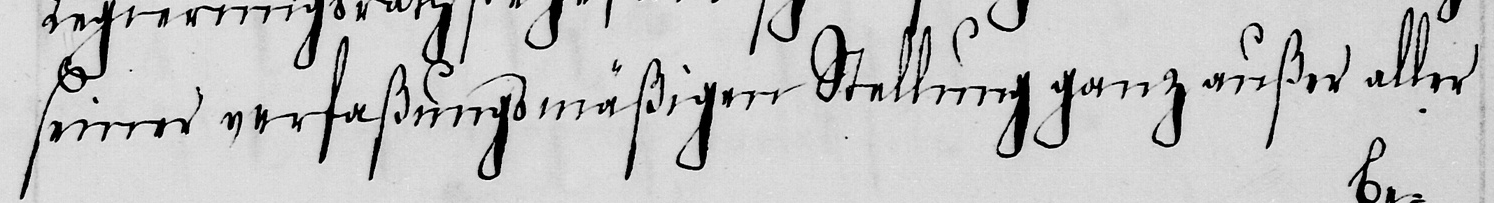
seiner verfaßungsmäßigen Stellung ganz außer aller
